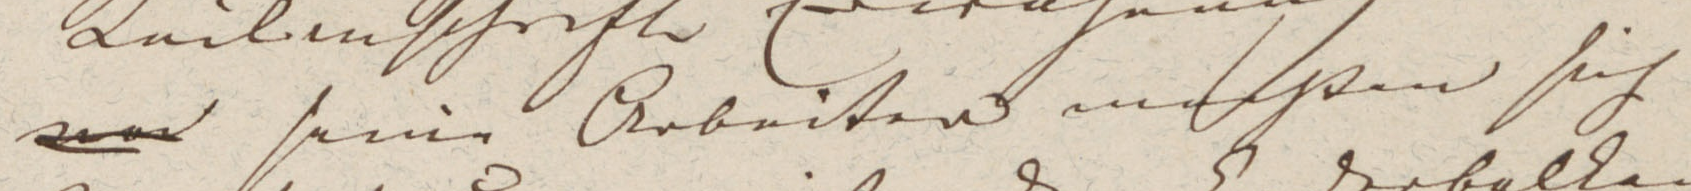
noc seine Arbeiter machten sich
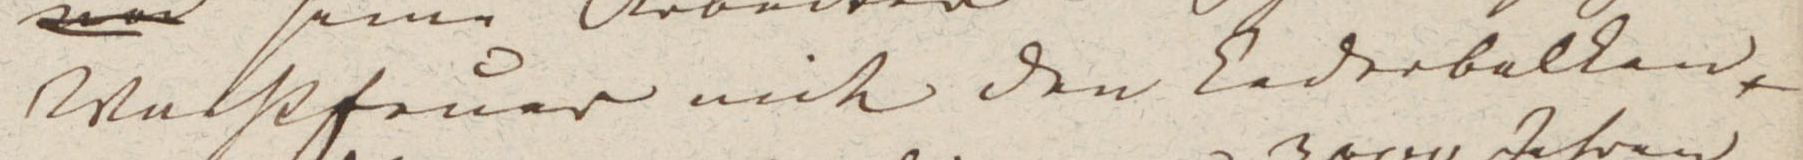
Wachtfeuer mit den Cederbalken,
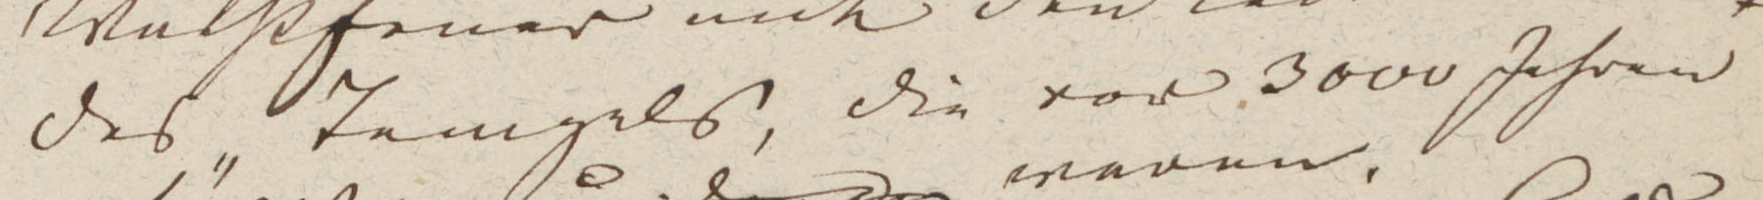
des Tempels, die vor 3000 Jahren
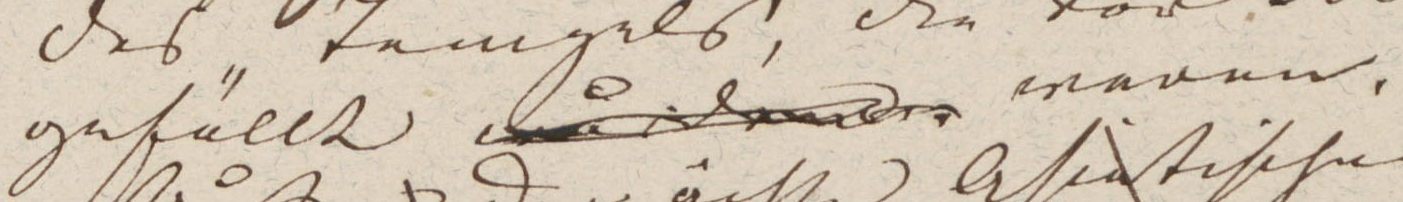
gefällt wurden waren.
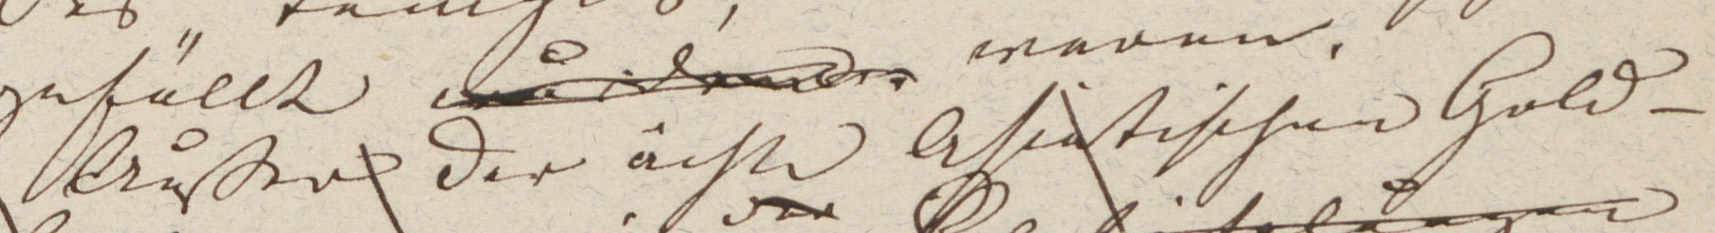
Ausser der ächt Asiatischen Gold-
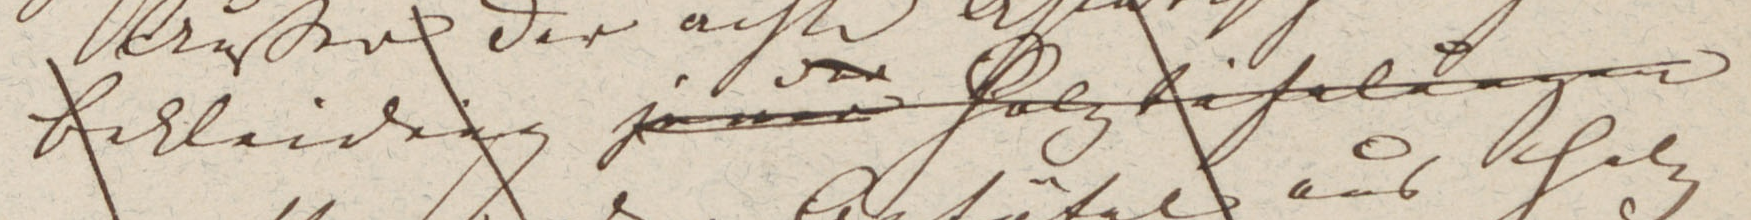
bekleidung jener der Polytäfelungen
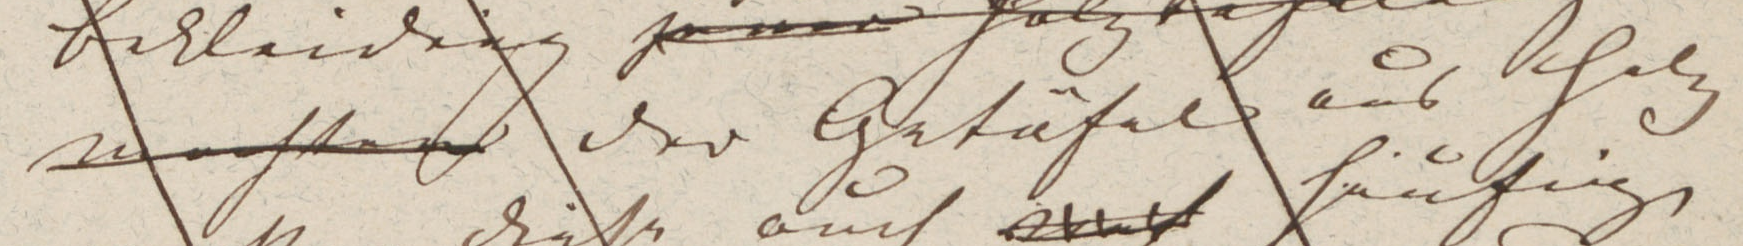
machten der Getäfel aus Holz
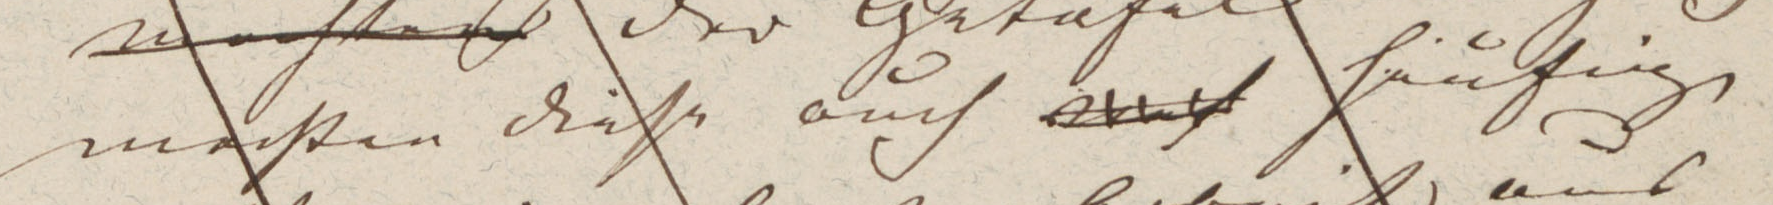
machten diese auch häufig
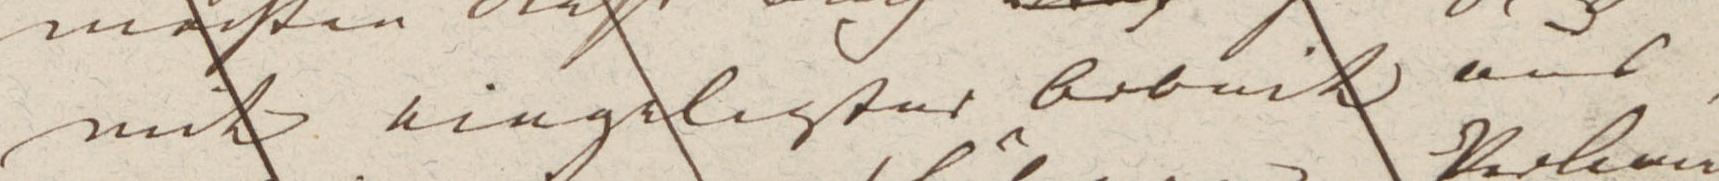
mit eingelegter Arbeit aus
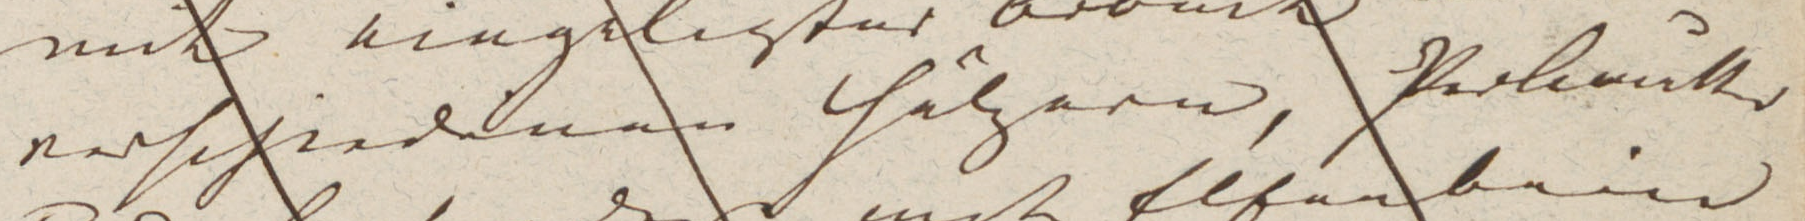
verschiedenen Hölzern, Perlmutter
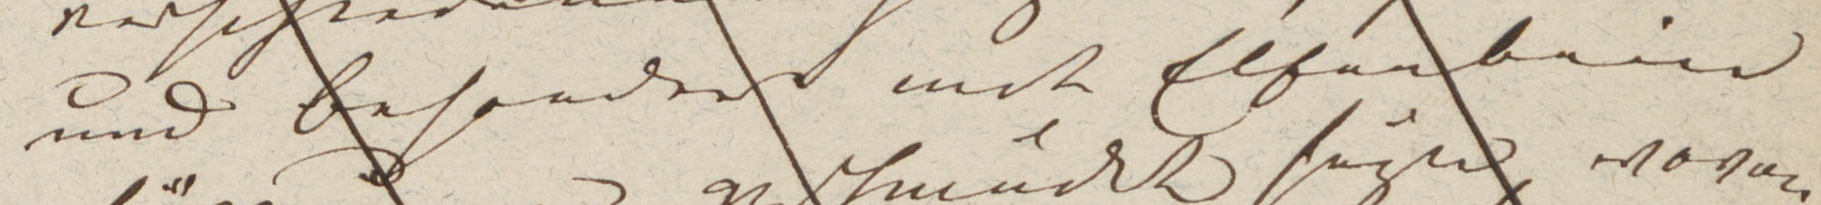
und besonders mit Elfenbein
